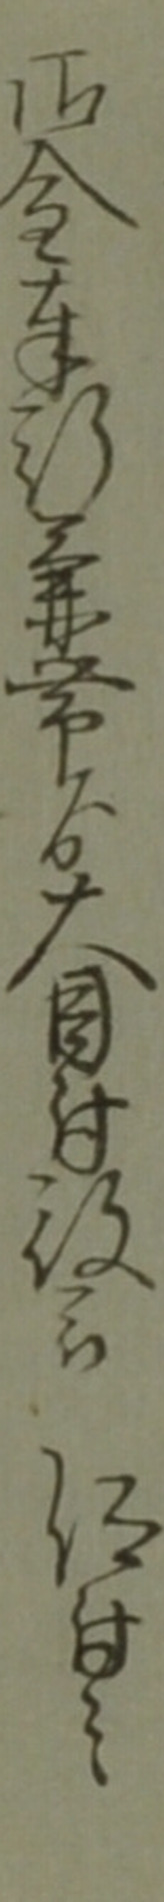御金奉行兼帯ゟ大目付役被仰付之
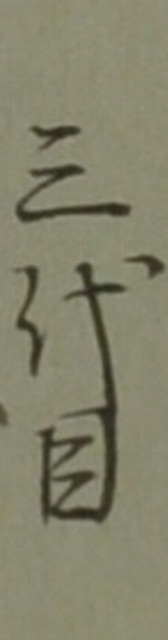三代目
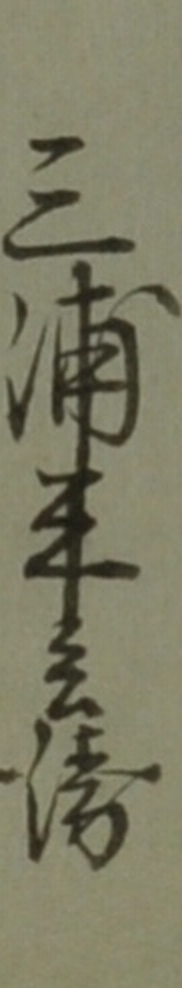三浦平兵衛
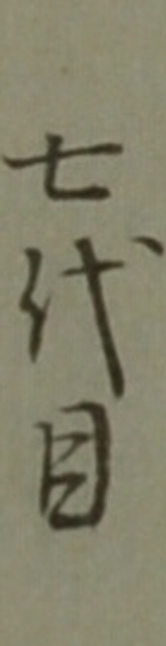七代目
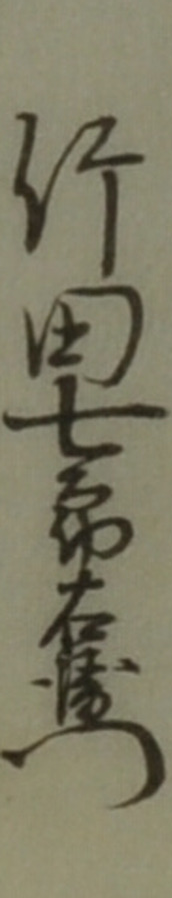竹田七郎右衛門
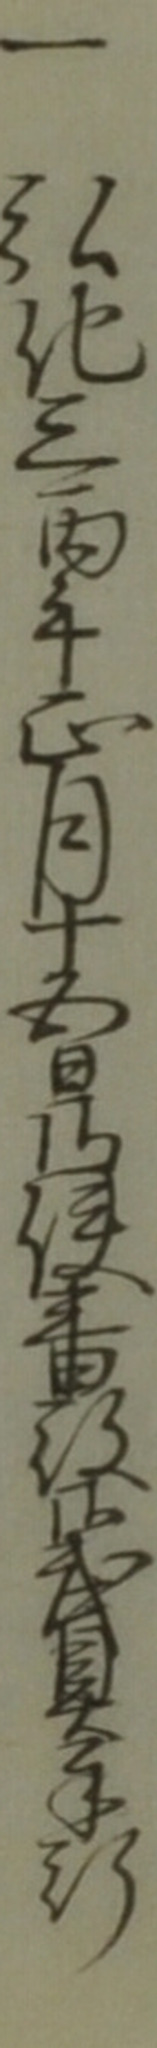一弘化三丙午正月十五日御使番役御武具奉行
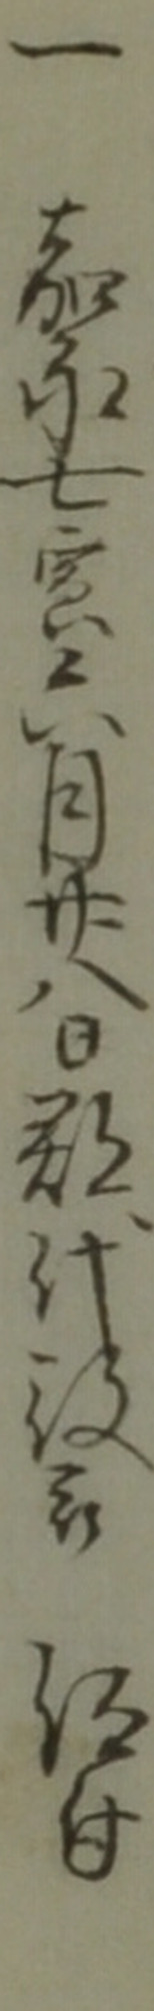一嘉永七寅六月廿八日郡代役被仰付
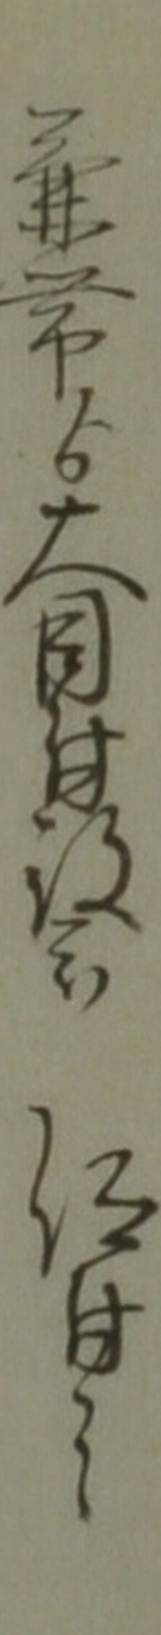兼帯ゟ大目付役被仰付之
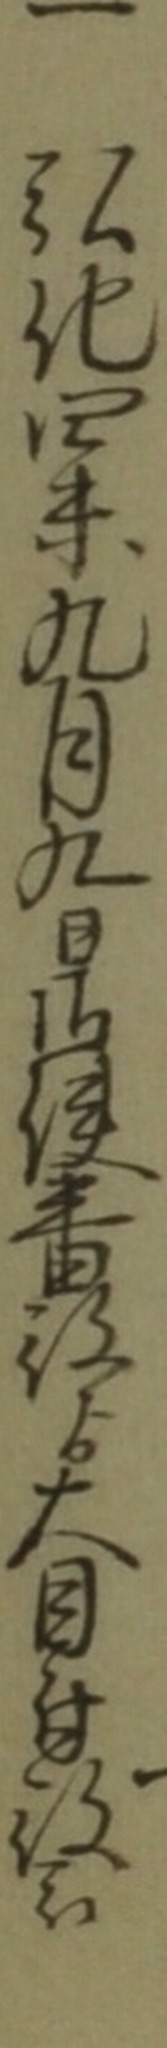一弘化四未九月九日御使番役ゟ大目付役被
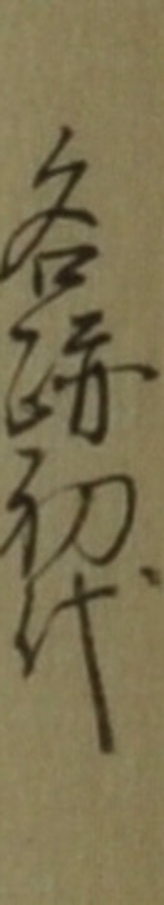名跡初代
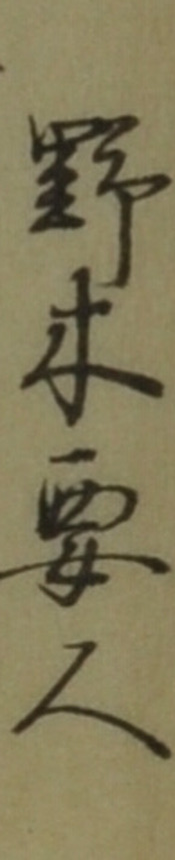野木要人

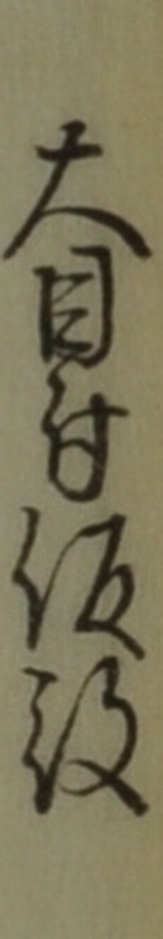大目付仮役
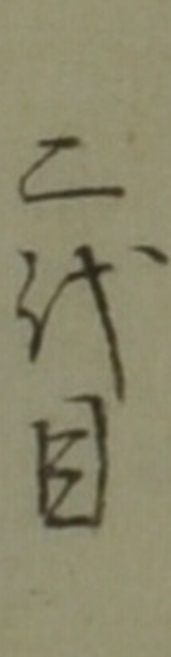二代目
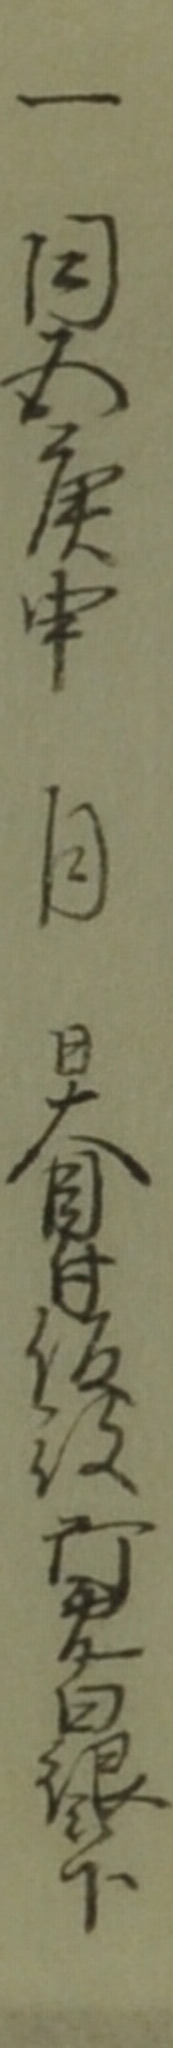一同五庚新申月日大目付仮役御免白銀被下
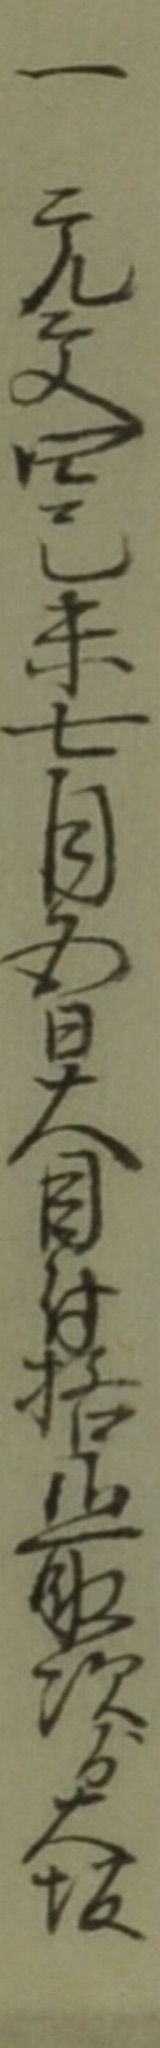一元文四己未七月五日大目付格御取次ゟ大坂
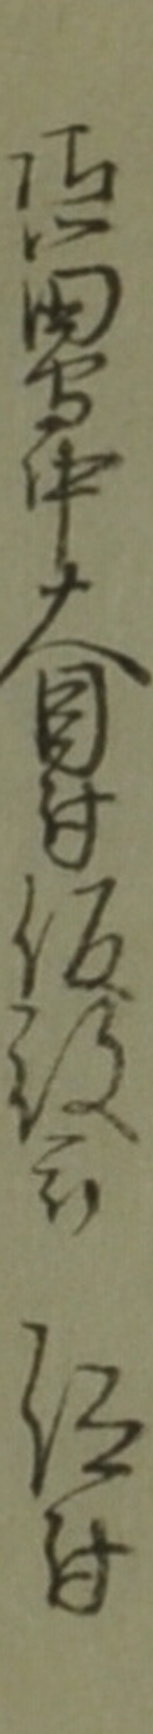仰付留守中大目付仮役被仰付
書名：諸御役代々録（三）
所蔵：伊那市立高遠町図書館・合同会社AMANE
